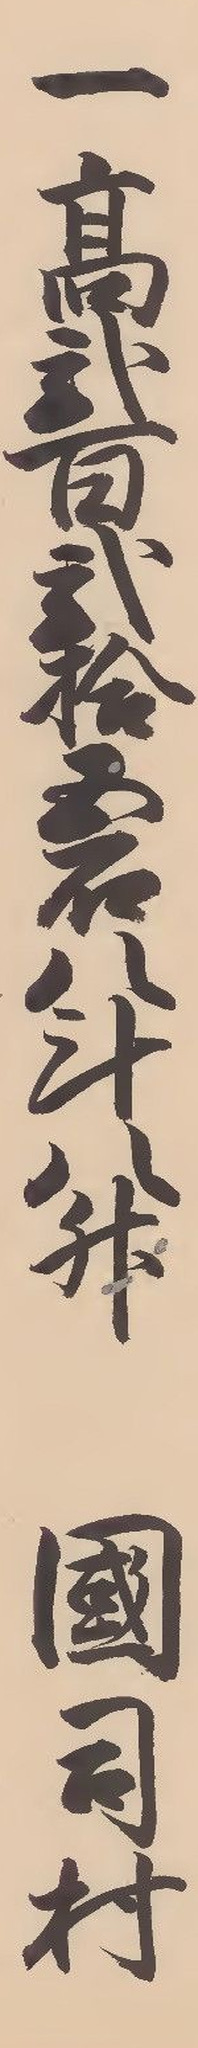一高弐百弐拾五石八斗八升国司村

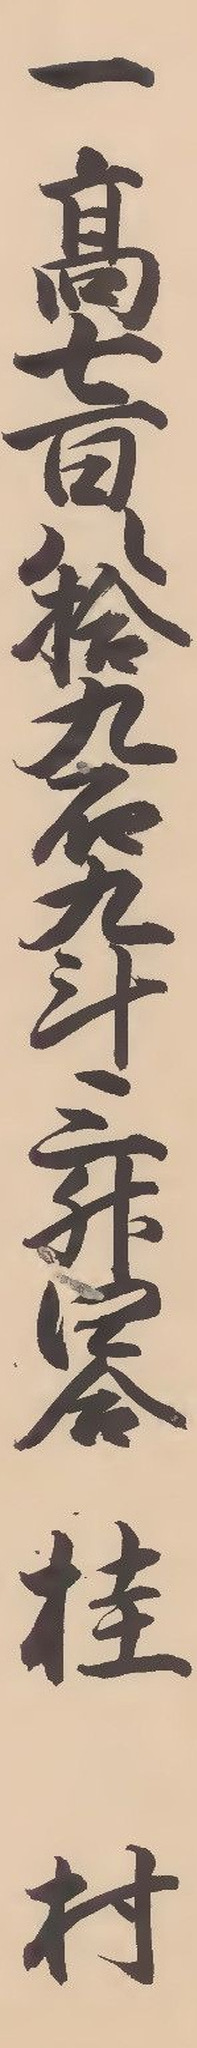一高七百八拾九石九斗三升四合桂村
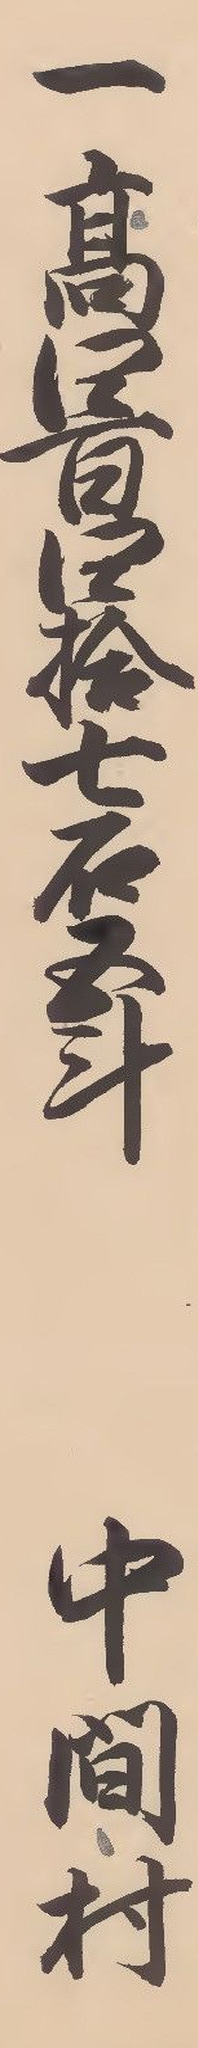一高四百四拾七石五斗中間村
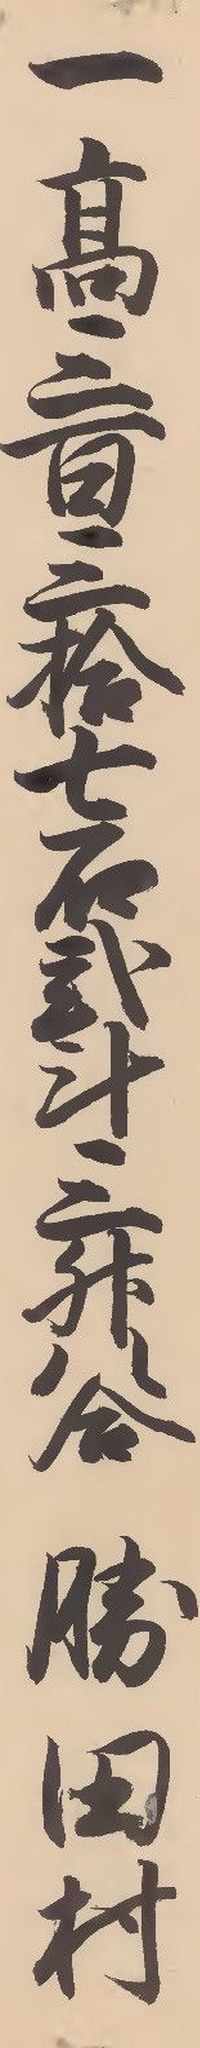一高三百三拾七石弐斗三升八合勝田村
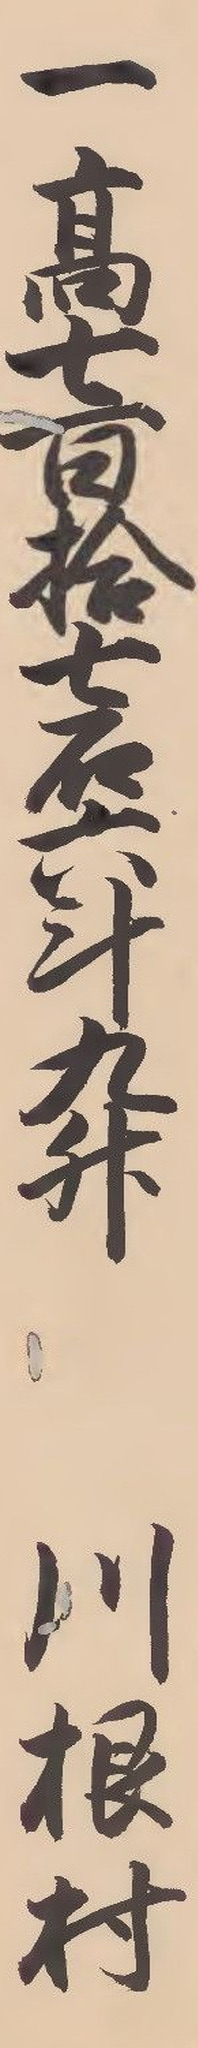一高七百拾七石六斗九升川根村
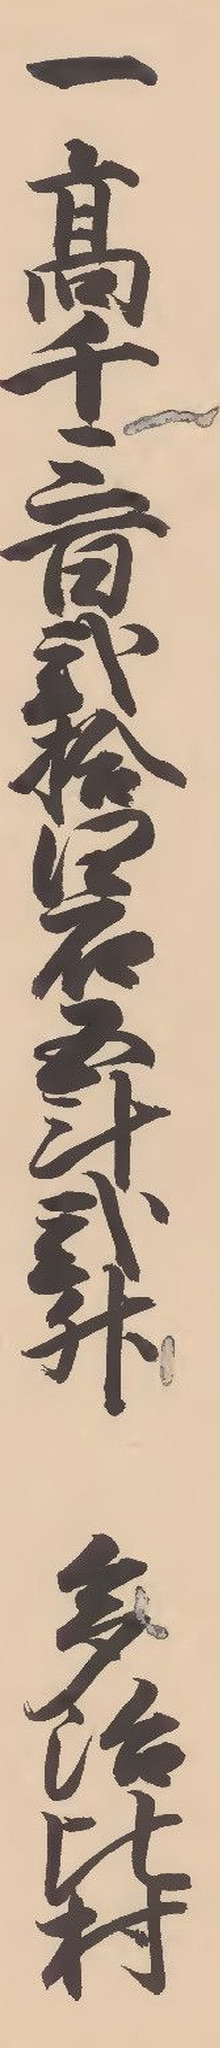一高千三百弐拾四石五斗弐升多治比村
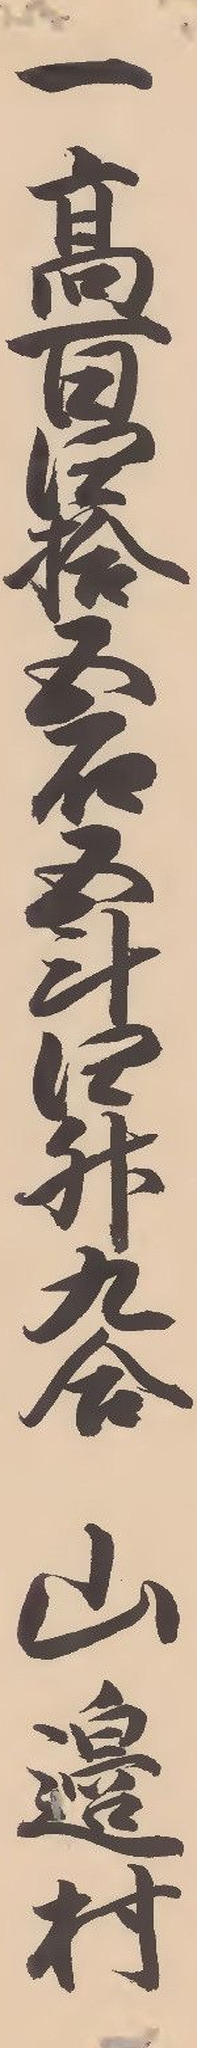一高百四拾五石五斗四升九合山辺村
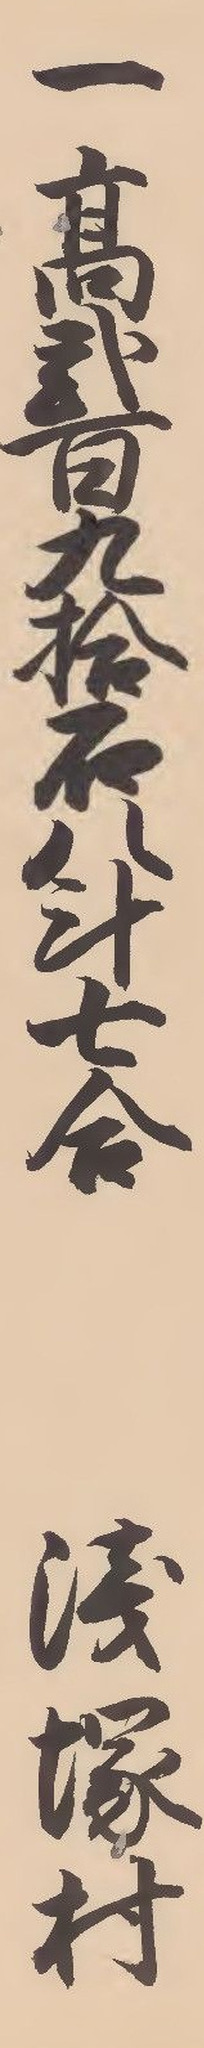一高弐百九拾石八斗七合浅塚村
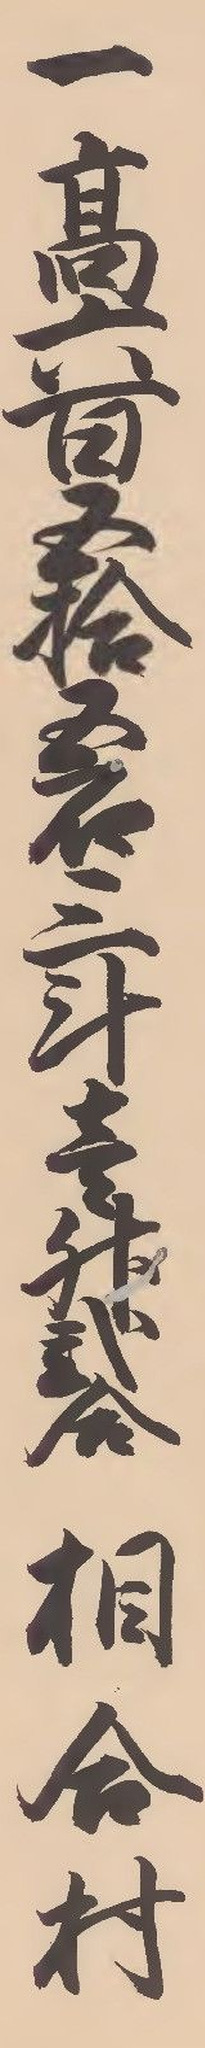一高六百五拾五石三斗壱升弐合相合村

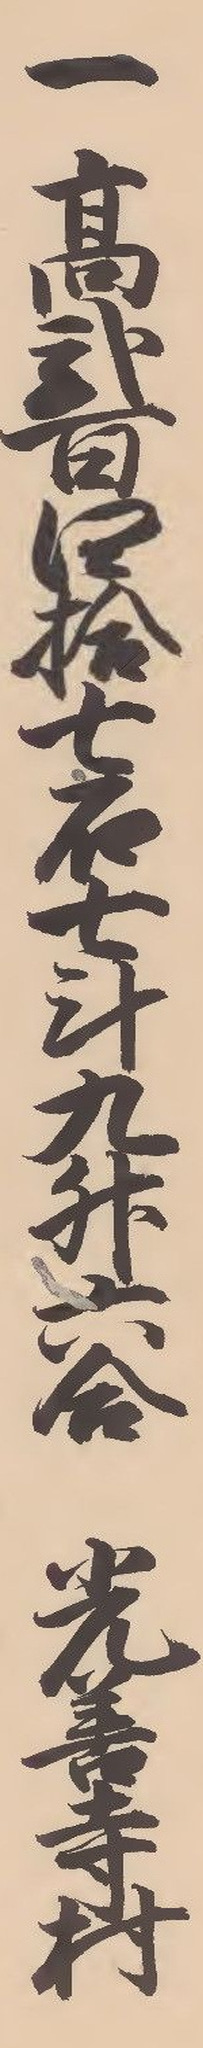一高弐百四拾七石七斗九升六合光善寺村
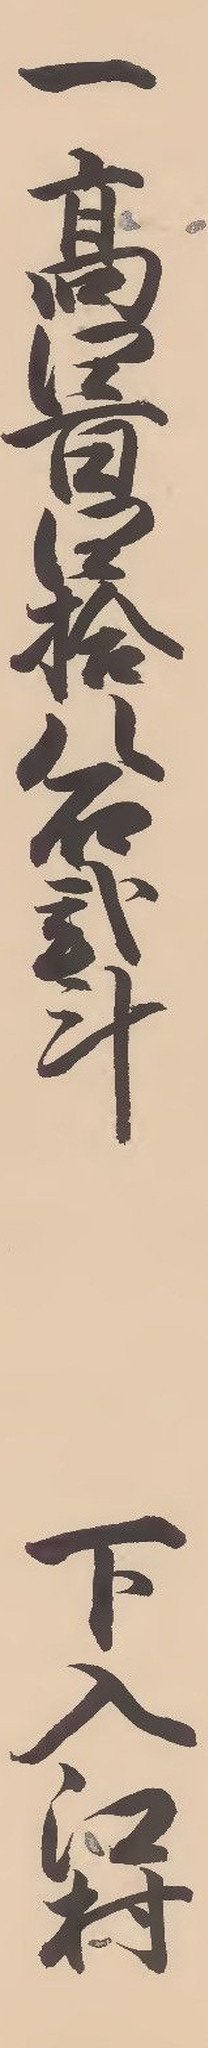一高四百四拾八石弐斗下入江村
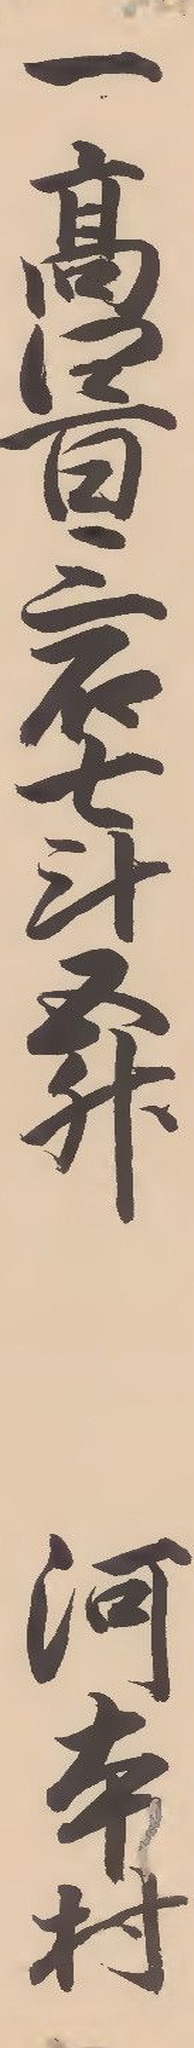一高四百三石七斗五升河本村
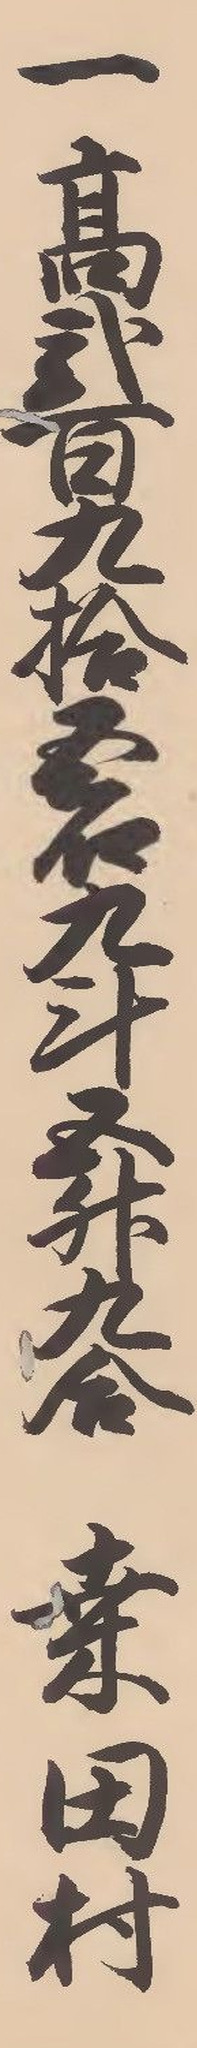一高弐百九拾五石九斗五升九合桑田村
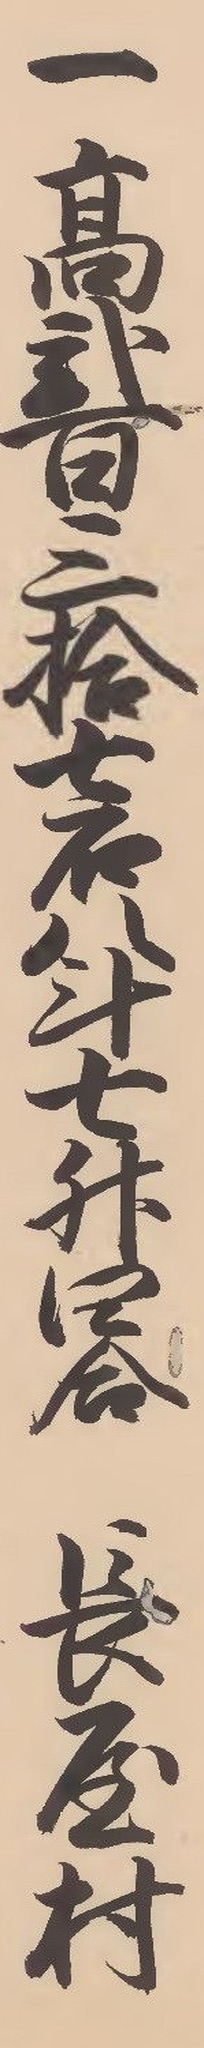一高弐百三拾七石八斗七升四合長屋村
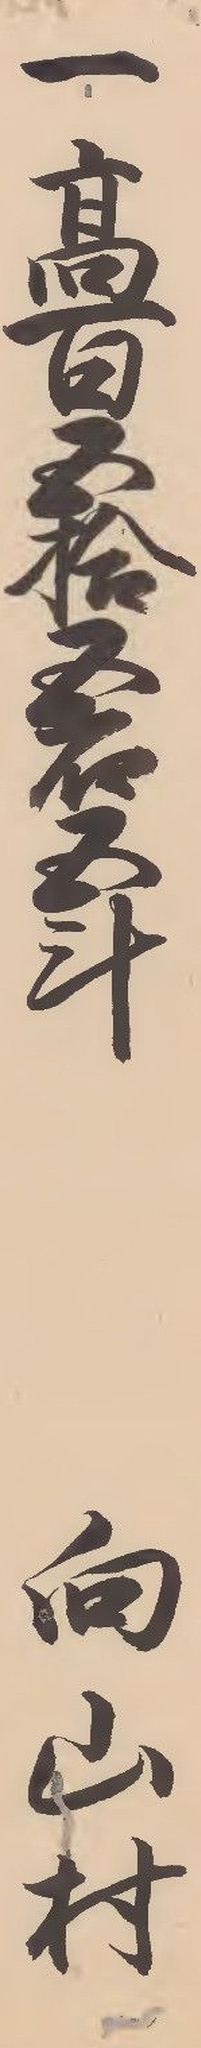一高百五拾五石五斗向山村
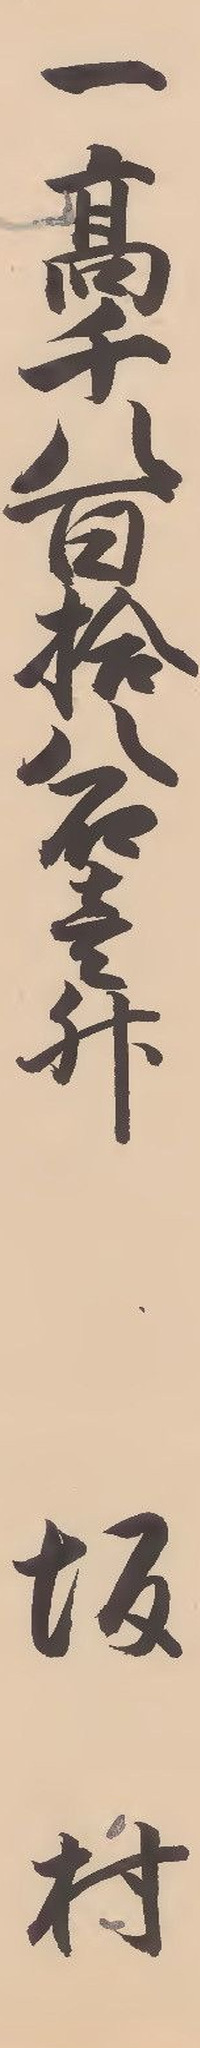一高千八百拾八石壱升坂村
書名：安芸国郷帳
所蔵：国立公文書館 National Archives of Japan
